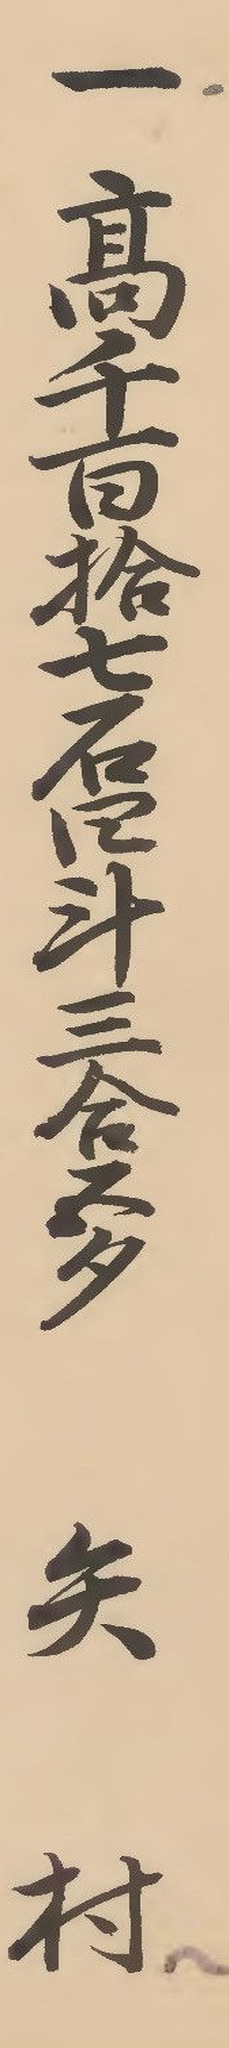一高千百拾七石四斗三合五勺矢村
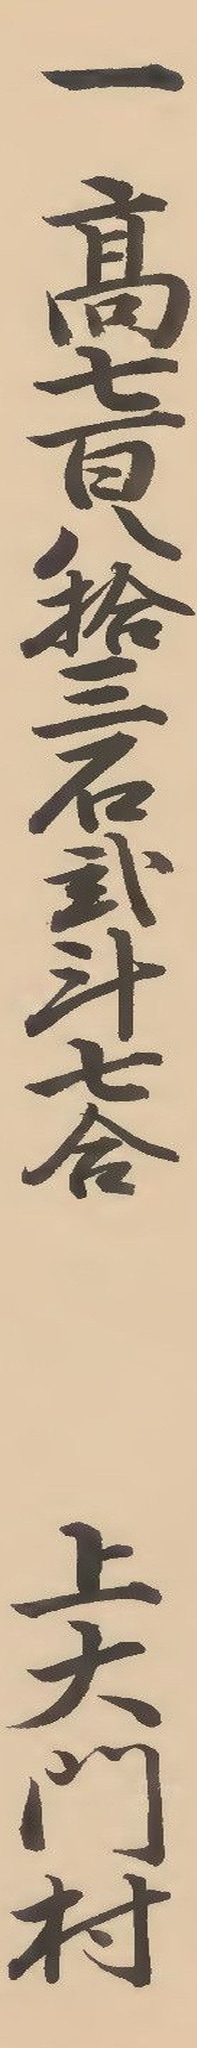一高七百八拾三石弐斗七合上大門村
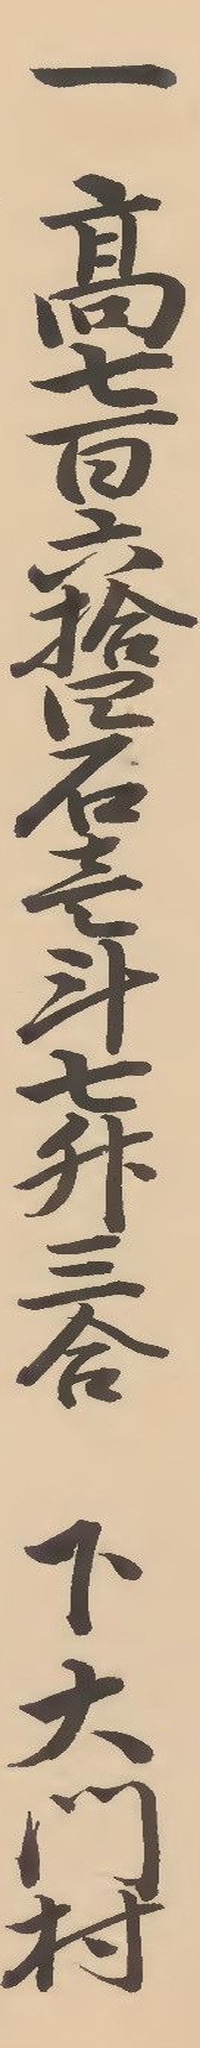一高七百六拾四石壱斗七升三合下大門村
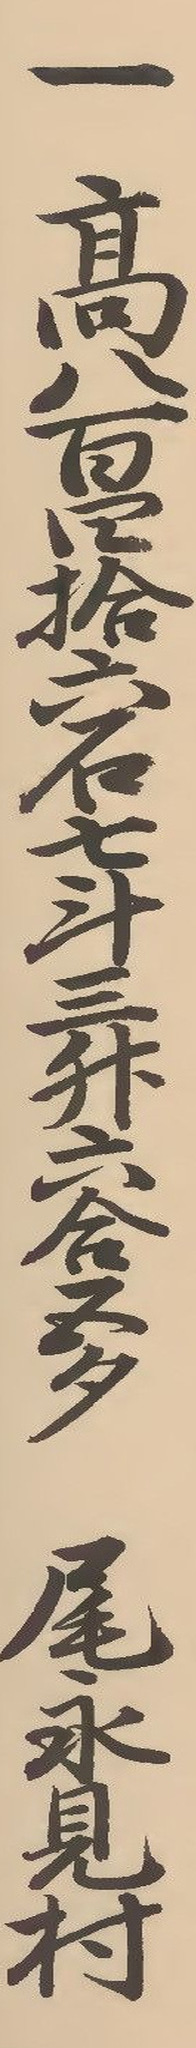一高八百四拾六石七斗三升六合五勺尾永見村
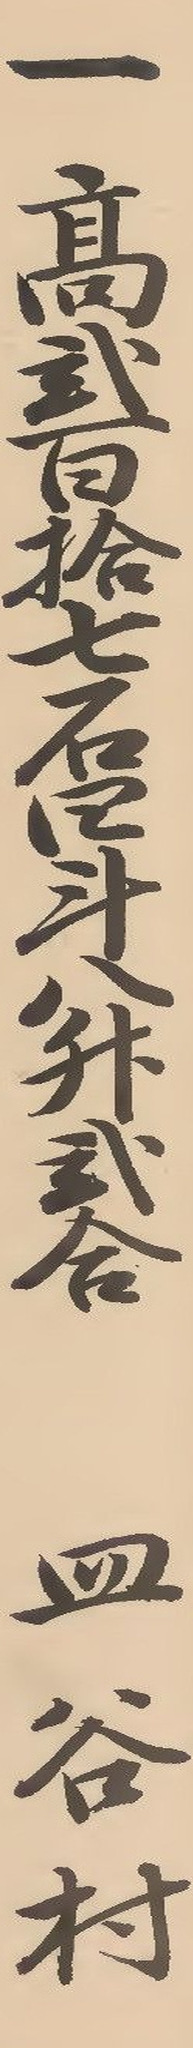一高弐百拾七石四斗八升弐合皿谷村
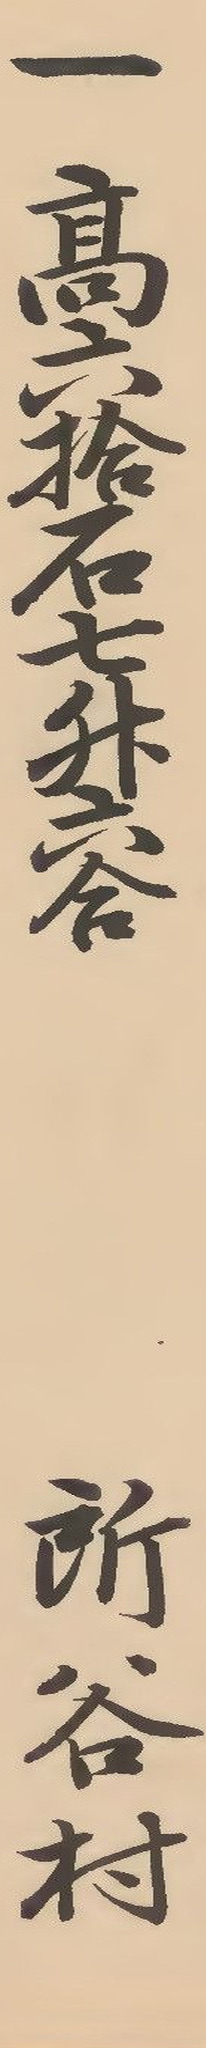一高六拾石七升六合所谷村
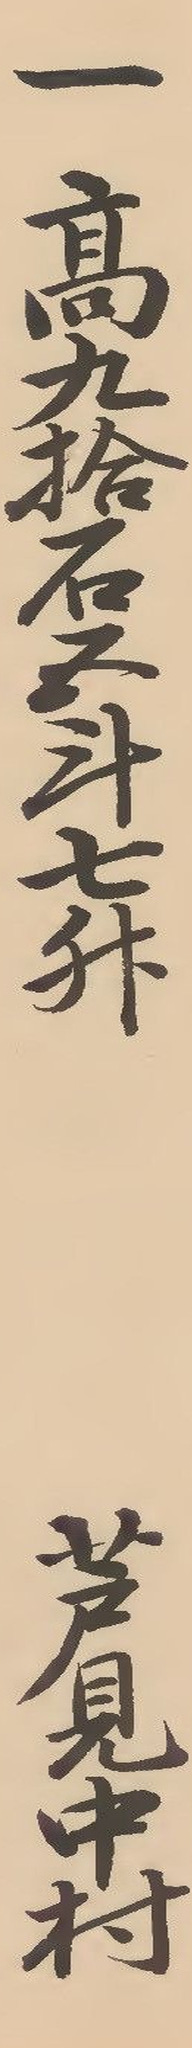一高九拾石五斗七升芦見中村
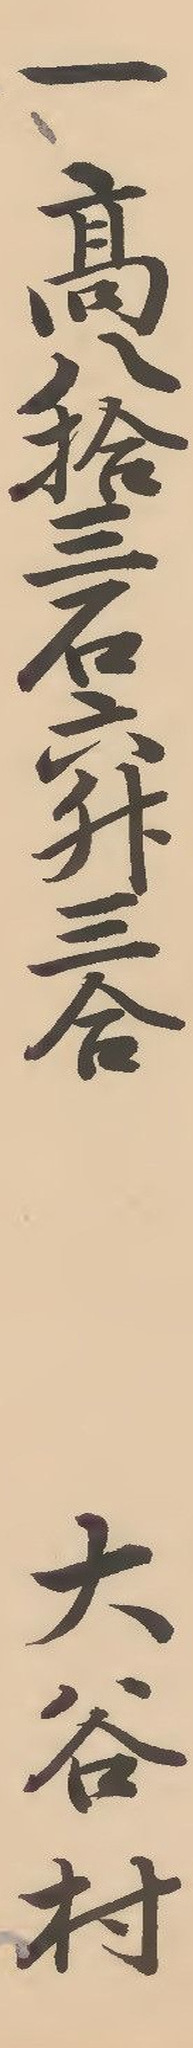一高八拾三石六升三合大谷村

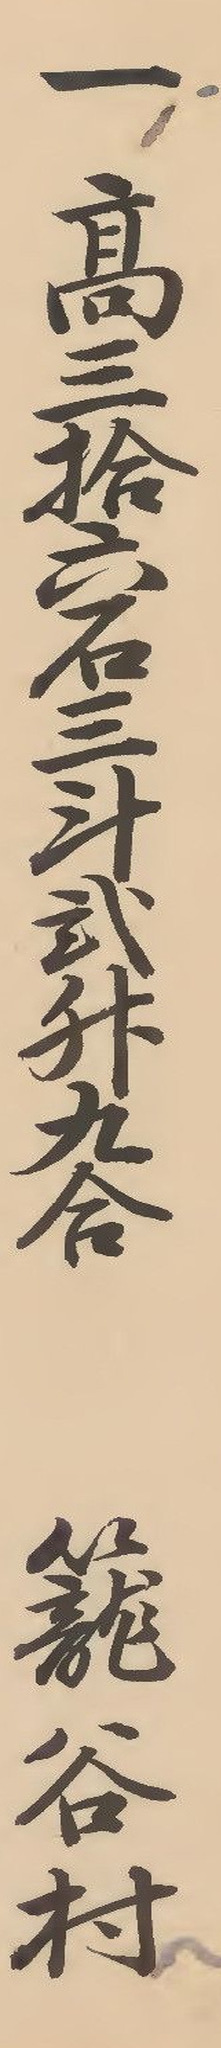一高三拾六石三斗弐升九合篭谷村
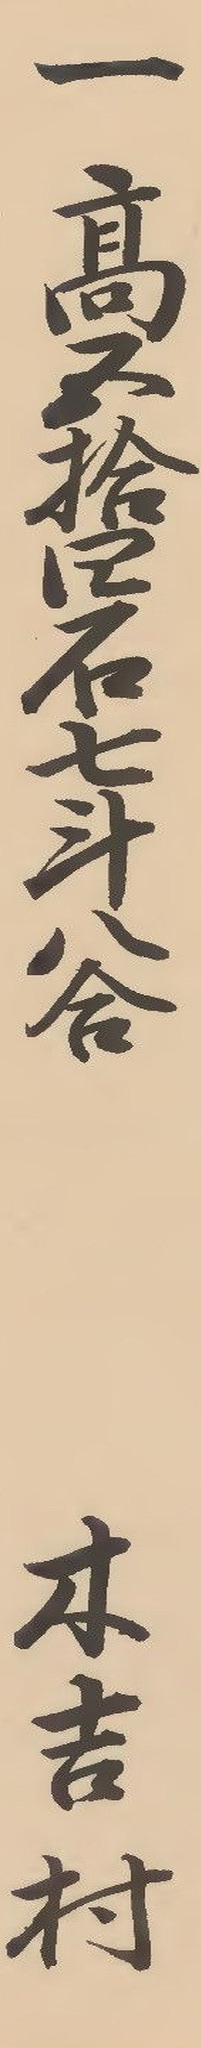一高五拾四石七斗八合木吉村
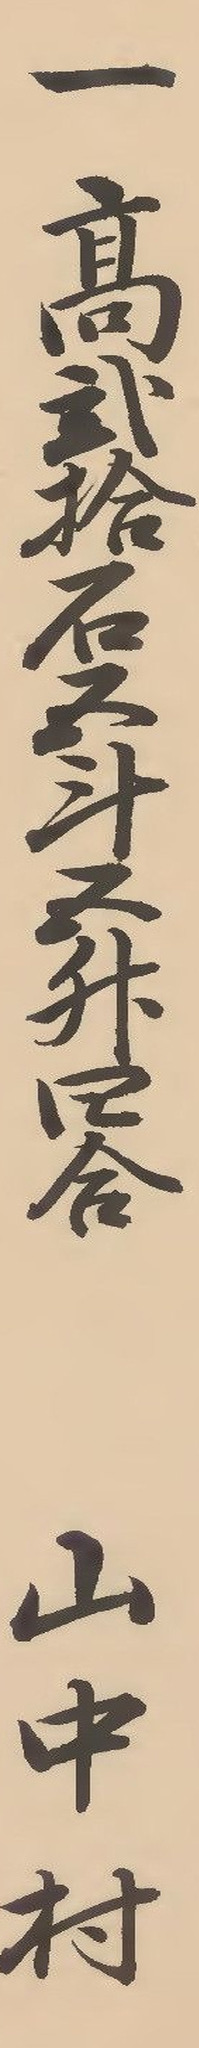一高弐拾石五斗五升四合山中村
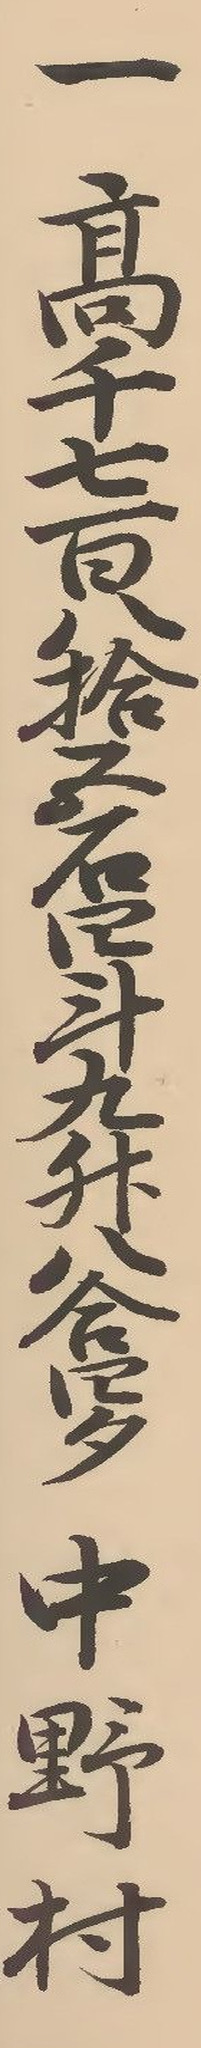一高千七百八拾五石四斗九升八合四勺中野村
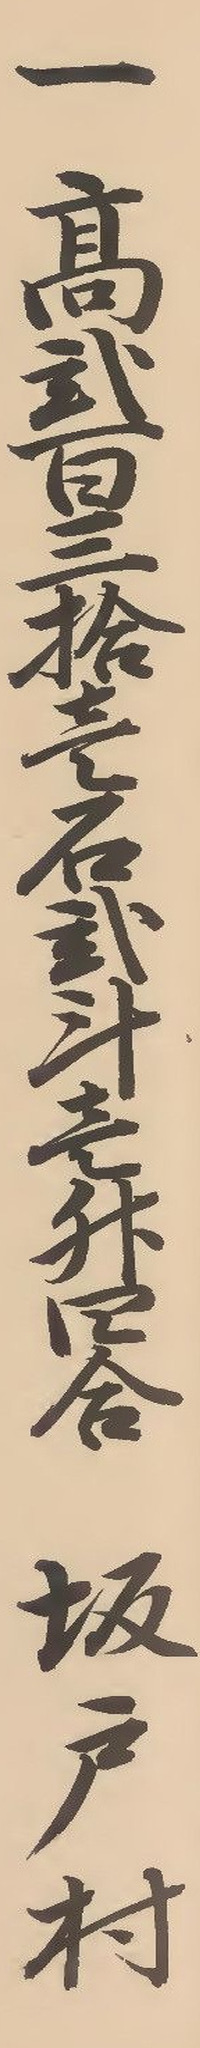一高弐百三拾壱石弐斗壱升四合坂戸村
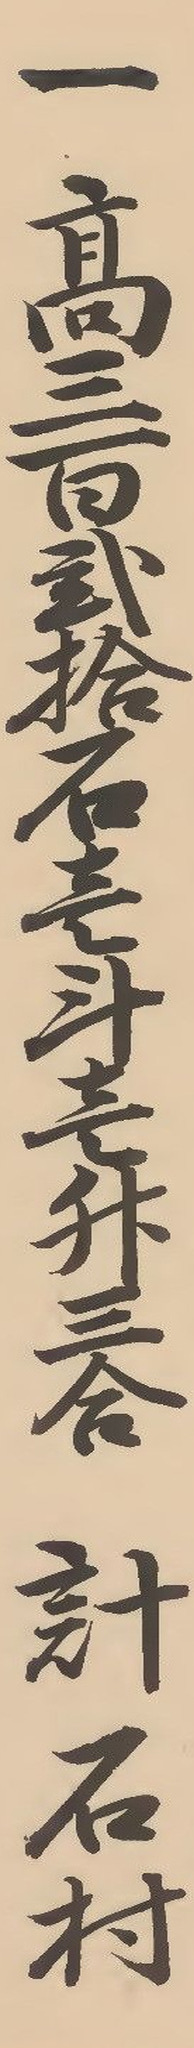一高三百弐拾石壱斗壱升三合計石村
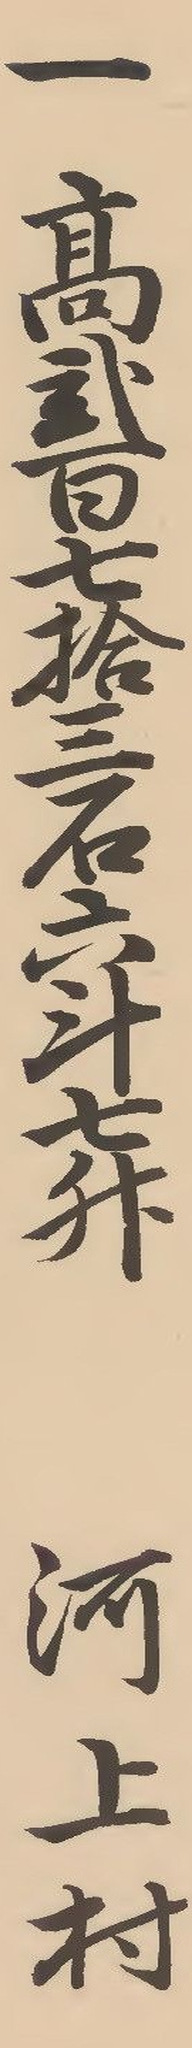一高弐百七拾三石六斗七升河上村
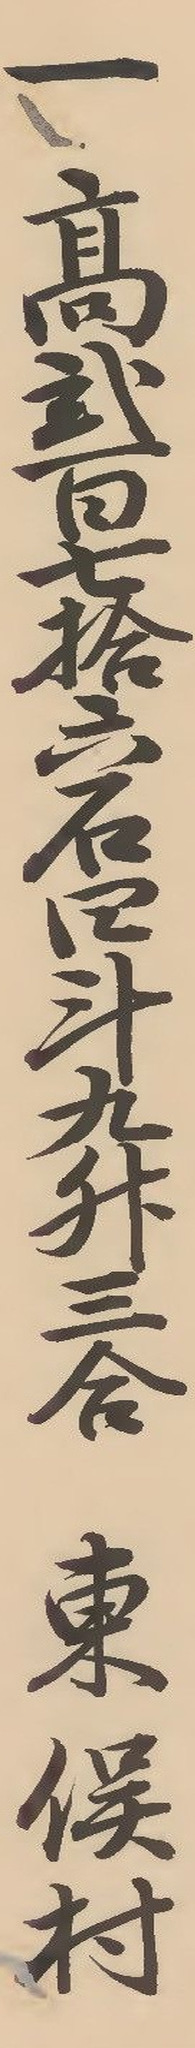一高弐百七拾六石四斗九升三合東俣村
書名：越前国郷帳
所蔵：国立公文書館 National Archives of Japan
